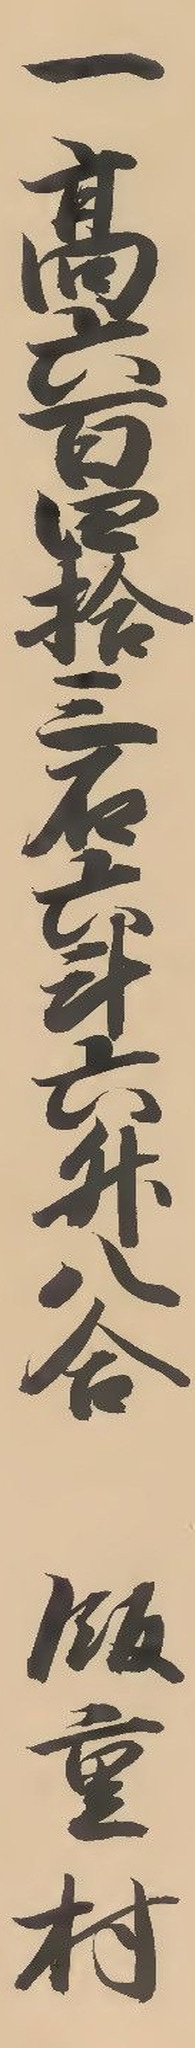一高六百四拾三石六斗六升八合飯重村
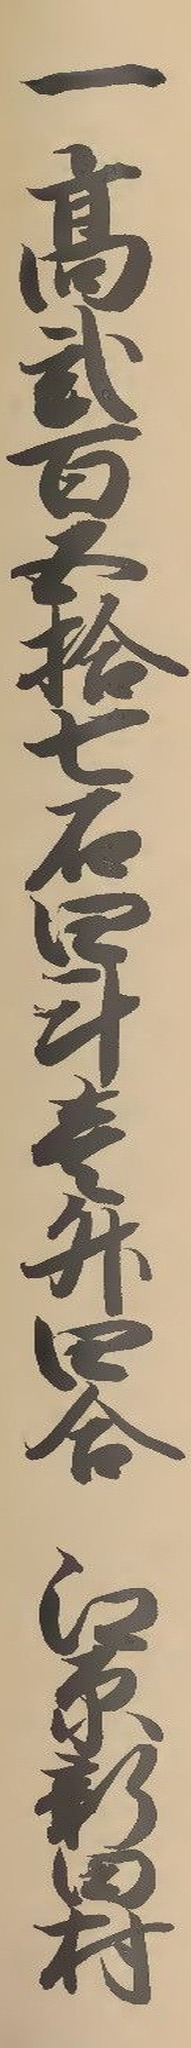一高弐百五拾七石四斗壱升四合江原新田村
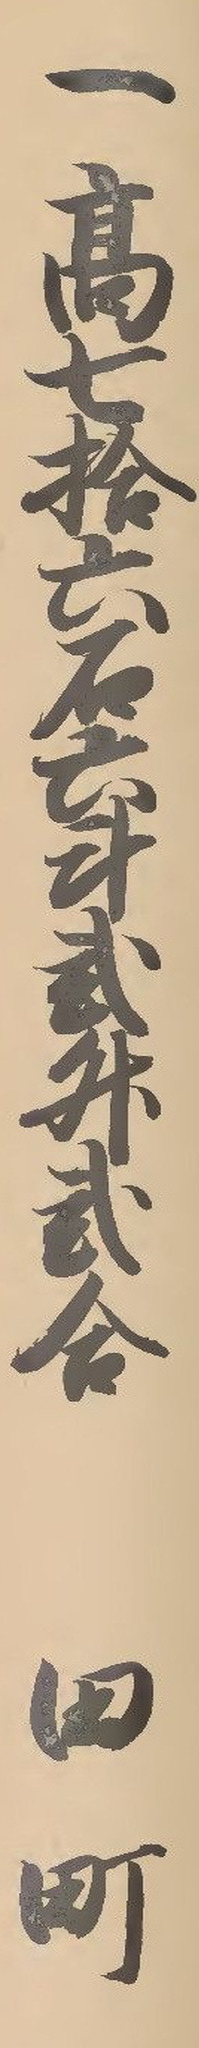一高七拾六石六斗弐升弐合田町
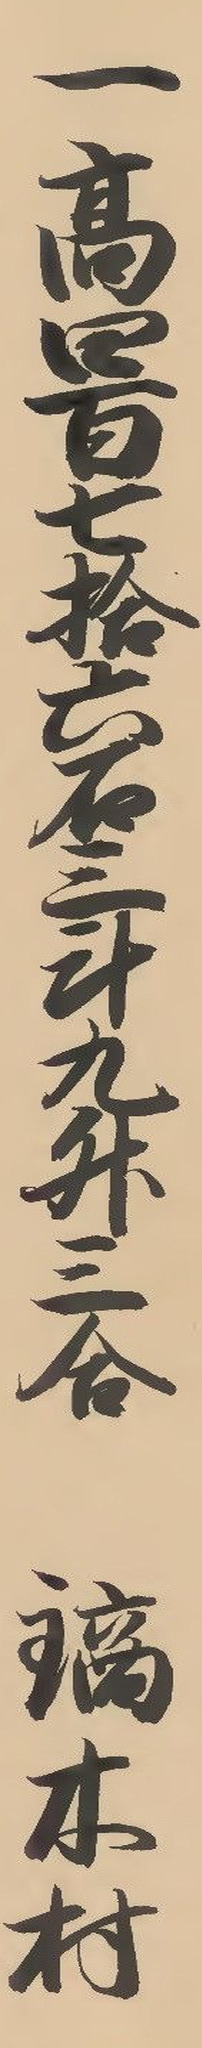一高四百七拾六石三斗九升三合鏑木村
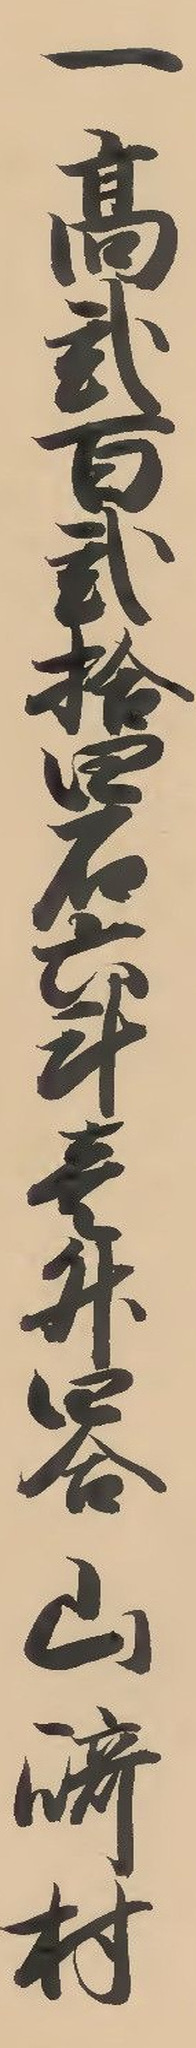一高弐百弐拾四石六斗壱升四合山崎村

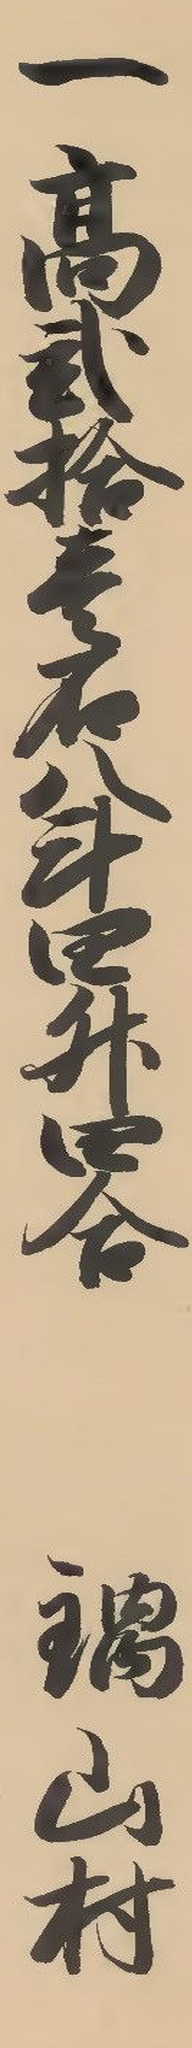一高弐拾壱石八斗四升四合鍋山村
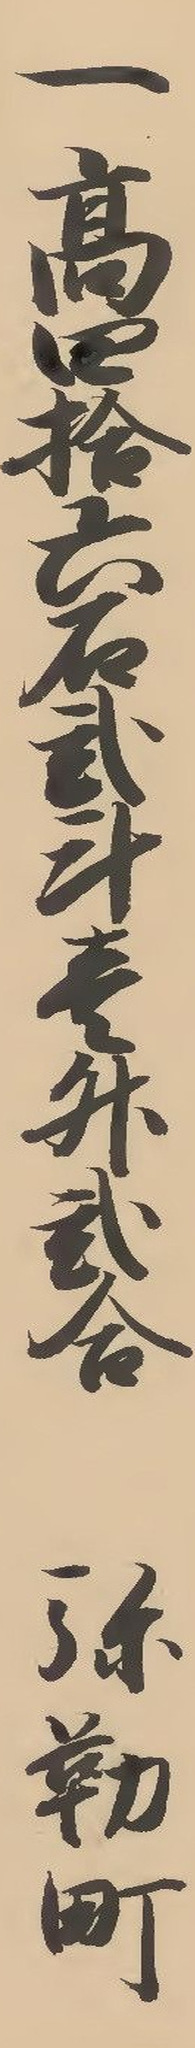一高四拾六石弐斗壱升弐合弥勒町
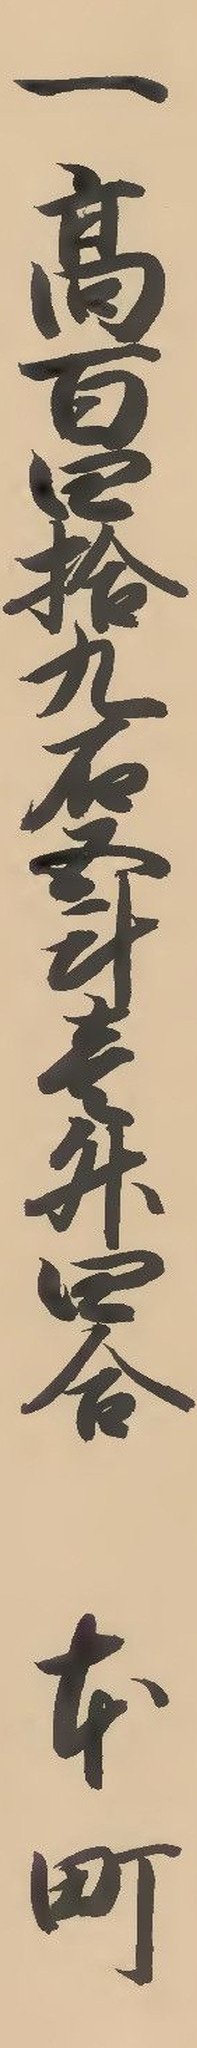一高百四拾九石五斗壱升四合本町
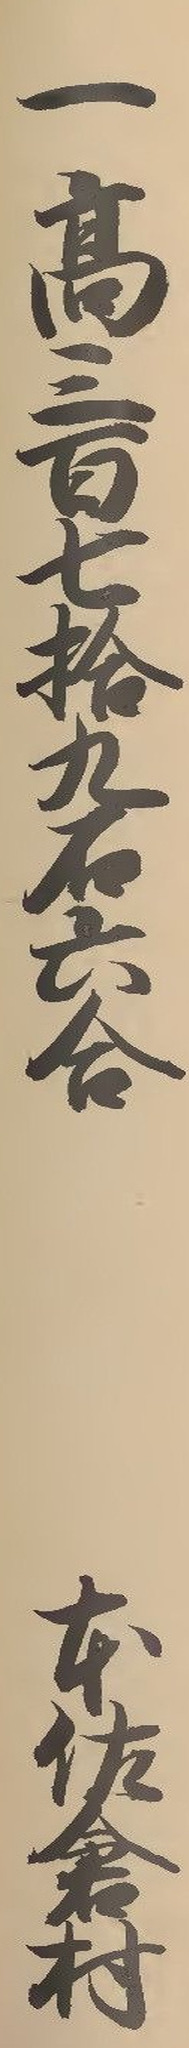一高三百七拾九石六合本佐倉村
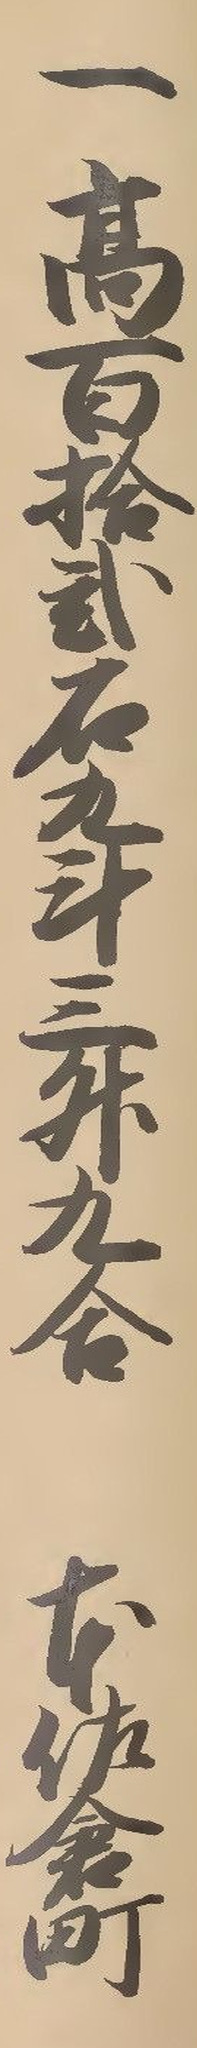一高百拾弐石九斗三升九合本佐倉町
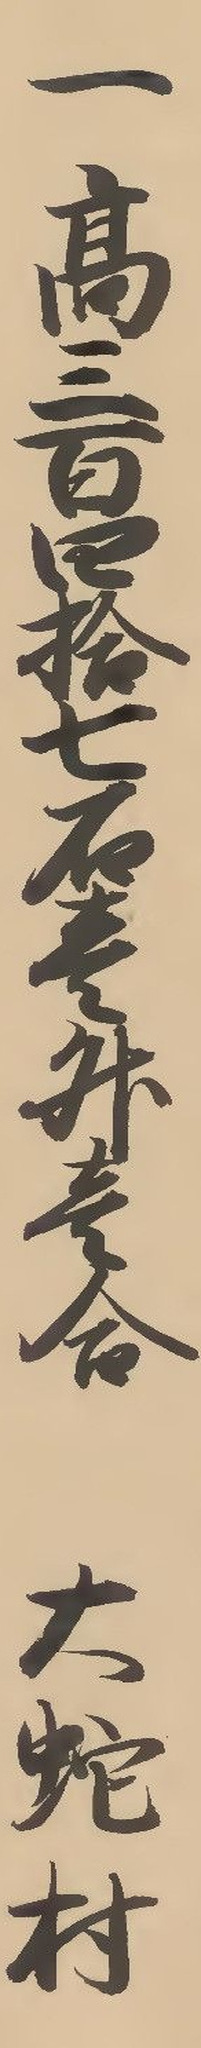一高三百四拾七石壱升壱合大蛇村
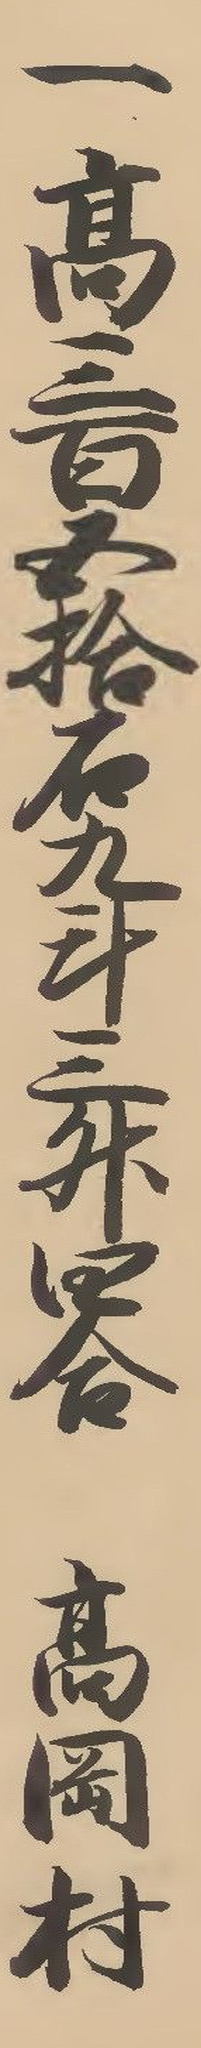一高三百五拾石九斗三升四合高岡村
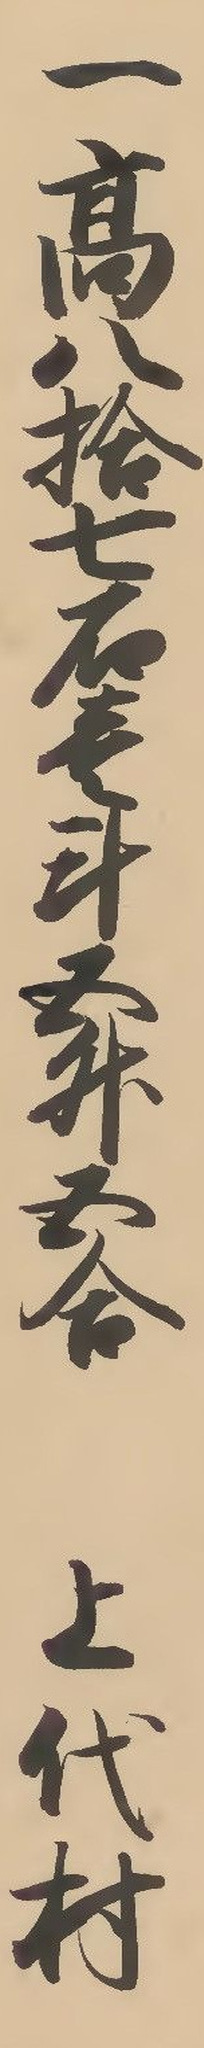一高八拾七石壱斗五升五合上代村

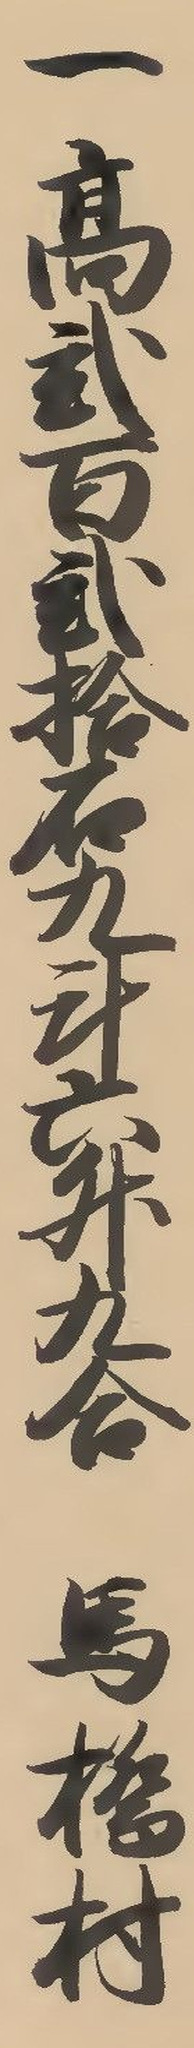一高弐百弐拾石九斗六升九合馬橋村
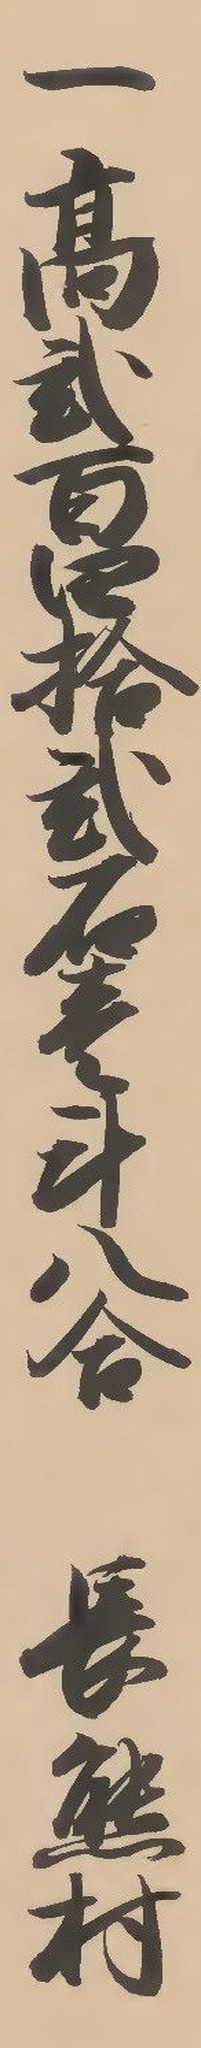一高弐百四拾弐石壱斗八合長熊村
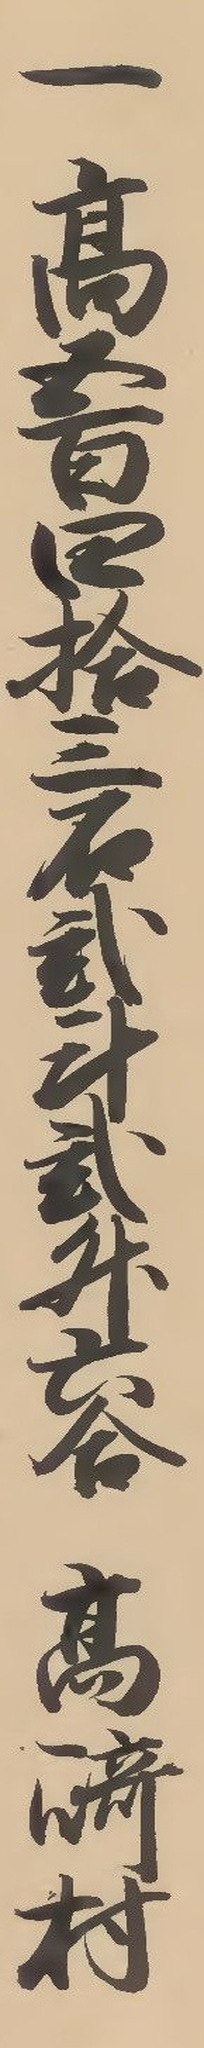一高五百四拾三石弐斗弐升六合高崎村
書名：下総国郷帳
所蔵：国立公文書館 National Archives of Japan
